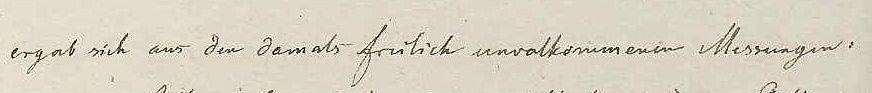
ergab sich aus den damals freilich unvolkommenen Messungen:
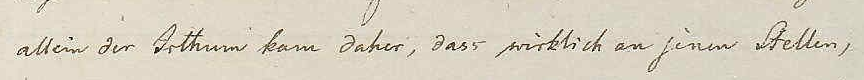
allein der Irthum kam daher, dass wirklich an jenen Stellen,
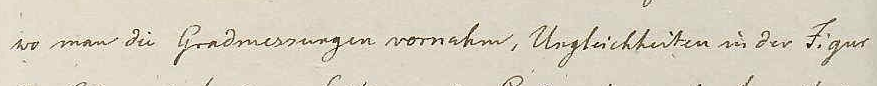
wo man die Gradmessungen vornahm, Ungleichheiten in der Figur
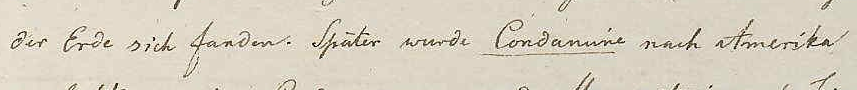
der Erde sich fanden. Später wurde Condamine nach Amerika
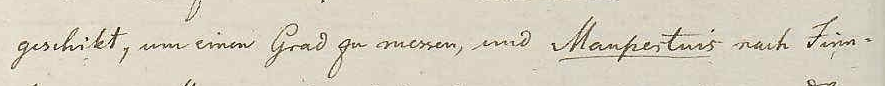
geschikt, um einen Grad zu messen, und Maupertuis nach Finn-
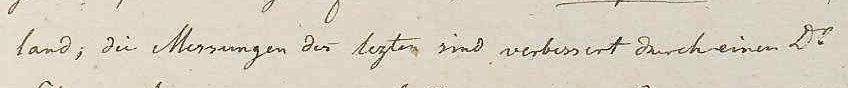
land; die Messungen des lezten sind verbessert durch einen Dr
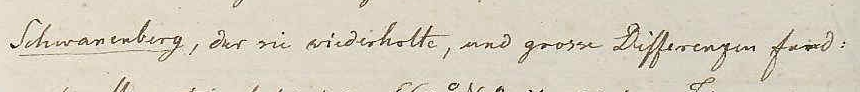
Schwanenberg, der sie wiederholte, und grosse Differenzen fand:
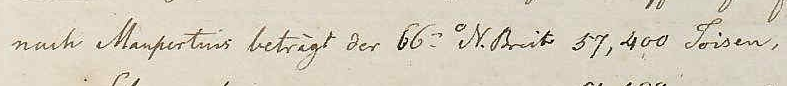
nach Maupertuis beträgt der 66￼° N. Breite 57,400 Toisen,
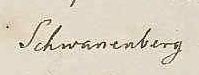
Schwanenberg
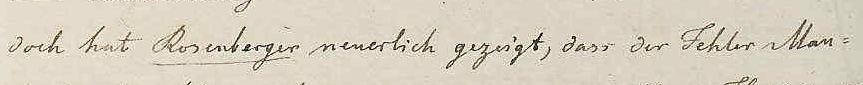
doch hat Rosenberger neuerlich gezeigt, dass der Fehler Mau-
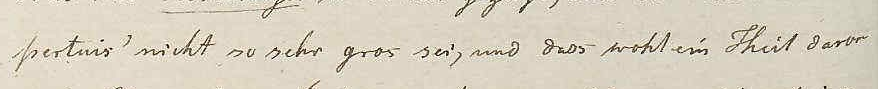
pertuis' nicht so sehr gros sei, und dass wohl ein Theil davon
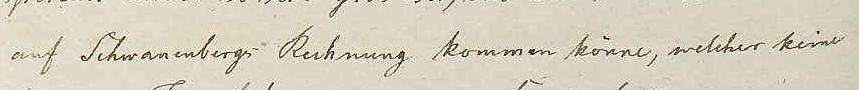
auf Schwanenbergs Rechnung kommen könne, welcher keine
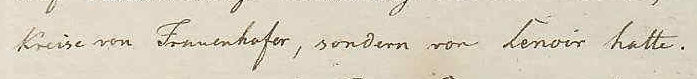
Kreise von Frauenhofer, sondern von Lenoir hatte.
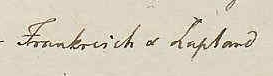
Frankreich & Lapland —
